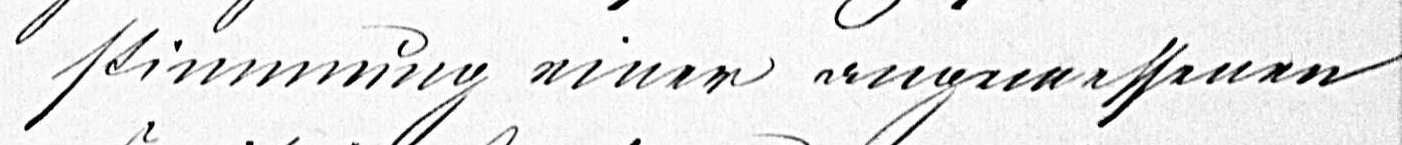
stimmung einer angemessenen
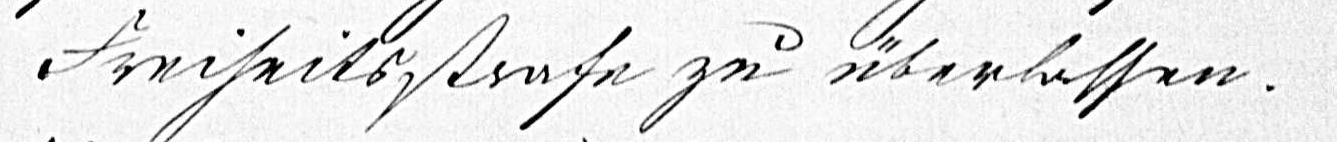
Freiheitsstrafe zu überlassen.
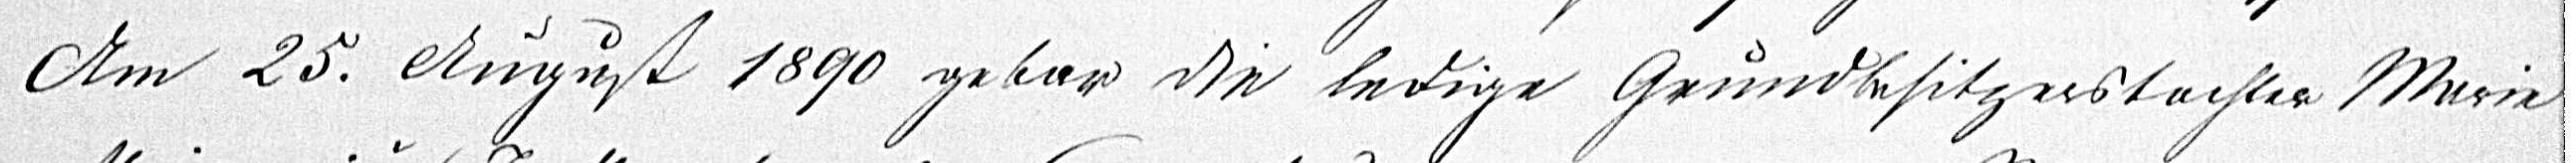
Am 25. August 1890 gebar die ledige Grundbesitzerstochter Marie
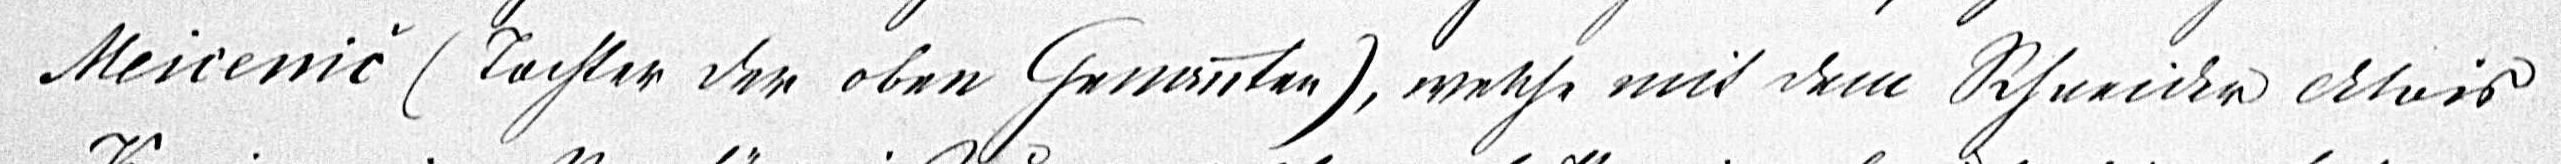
Meicenič (Tochter der oben Genannten), welche mit dem Schneider Alois
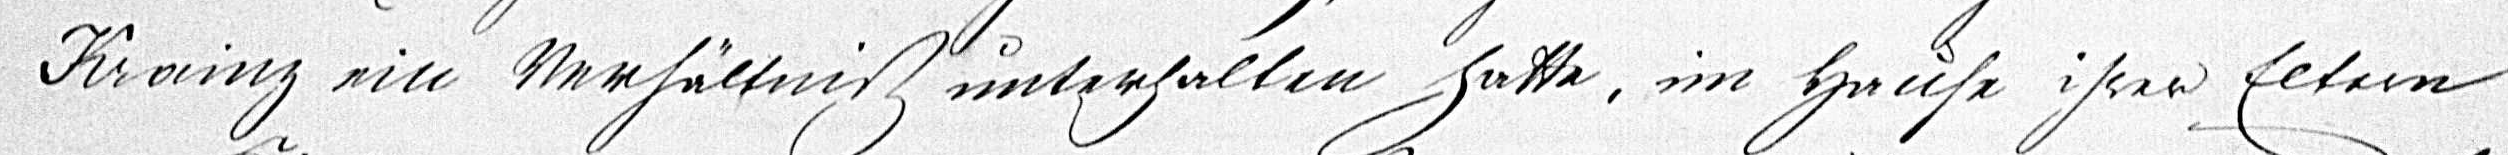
Krainz ein Verhältniß unterhalten hatte, im Hause ihre Eltern
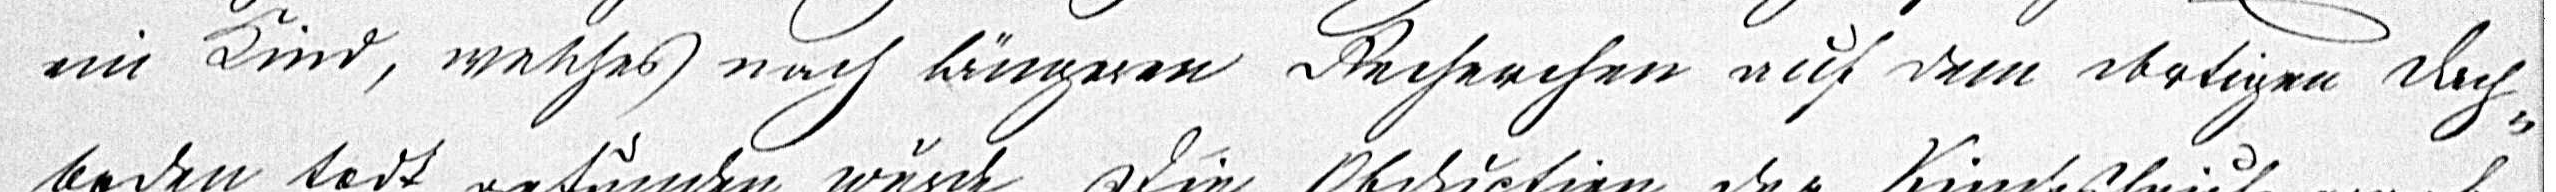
ein Kind, welches nach längeren Recherchen auf dem dortigen Dach¬
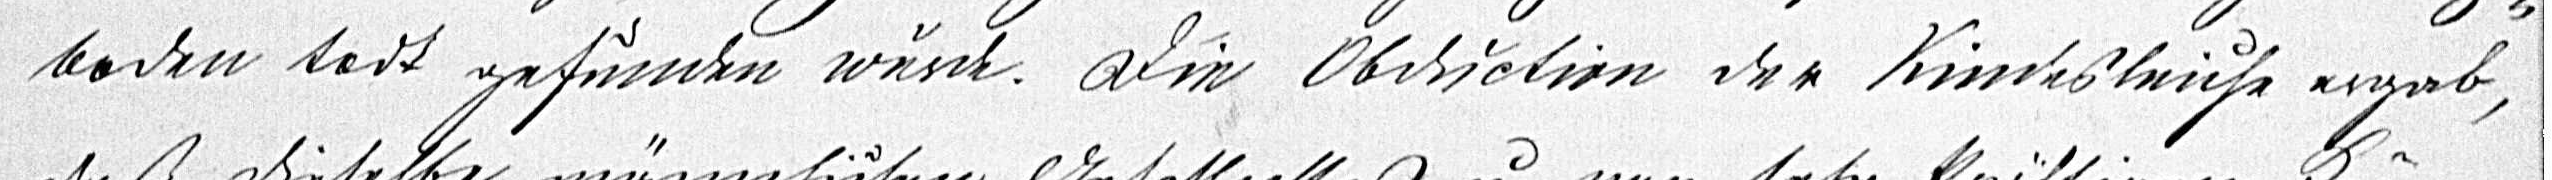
boden todt gefunden wurde. Die Obduction der Kindesleiche ergab,
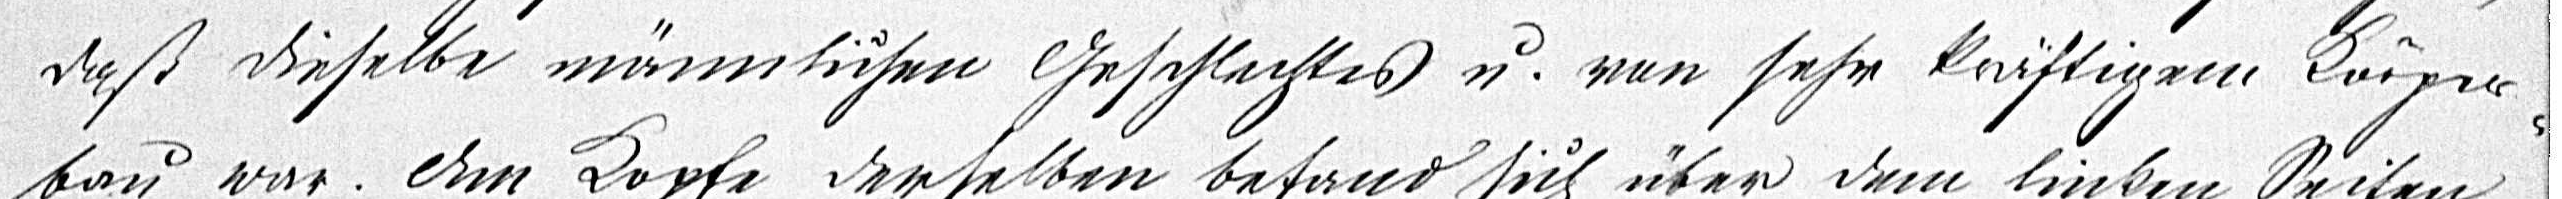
daß dieselbe männlichen Geschlechtes u. von sehr kräftigem Körper¬
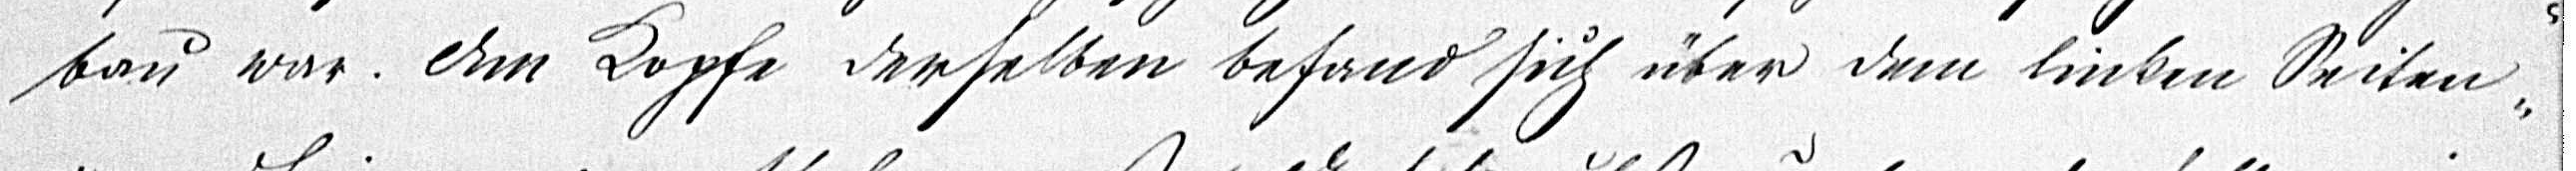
bau war. Am Kopfe derselben befand sich über dem linken Seiten¬
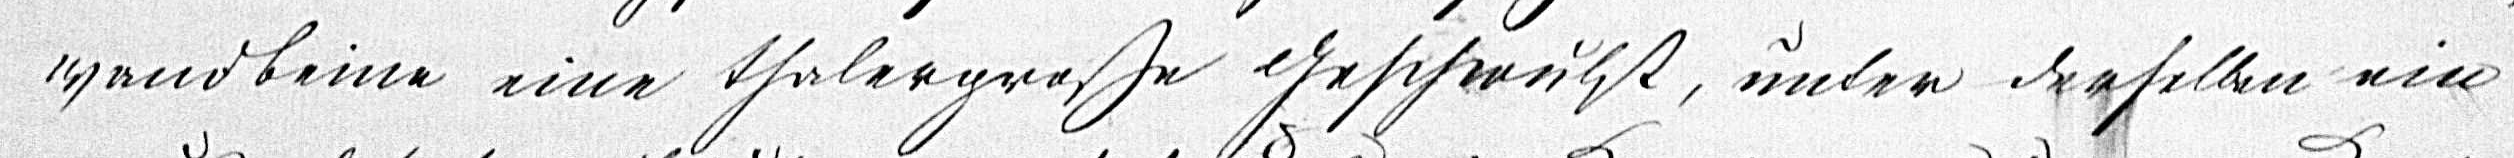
wandbeine eine thalergroße Geschwulst, unter derselben ein
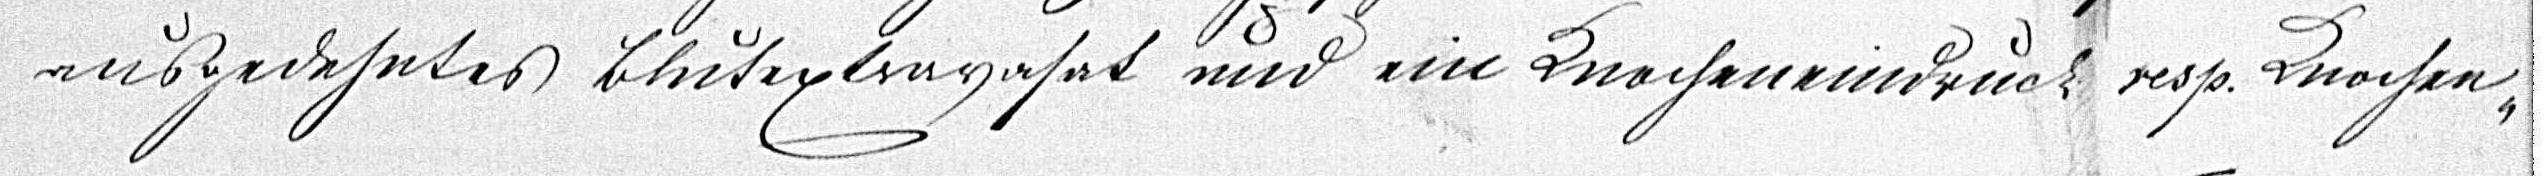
ausgedehntes Blutextravasat und ein Knocheneindruck resp. Knochen¬
